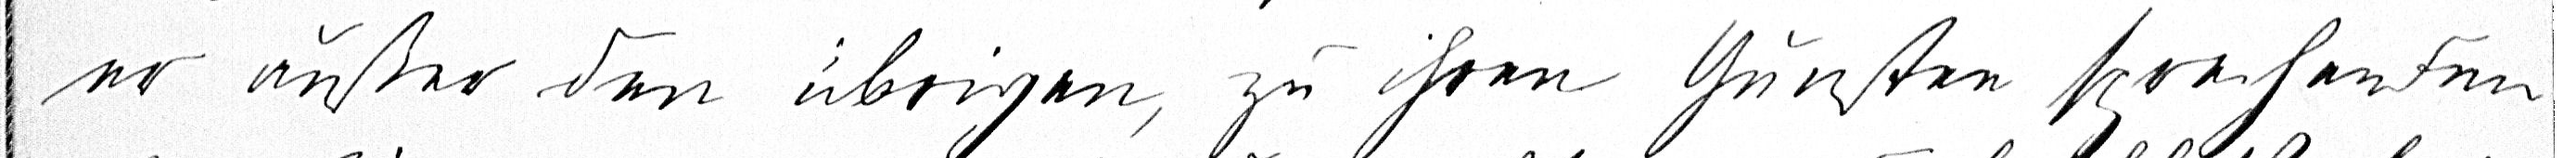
er außer den übrigen, zu ihren xxrsten sprechenden
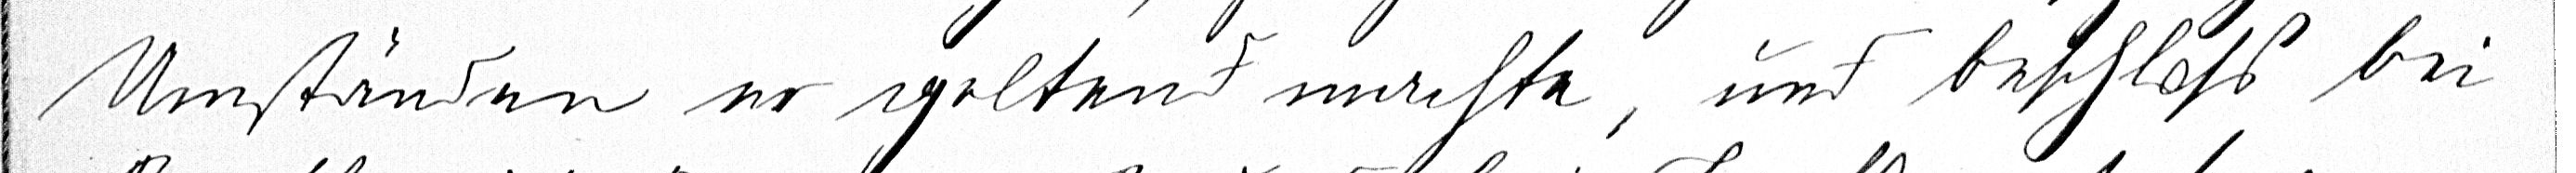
Umständen er geltend machte, und beschloss bei
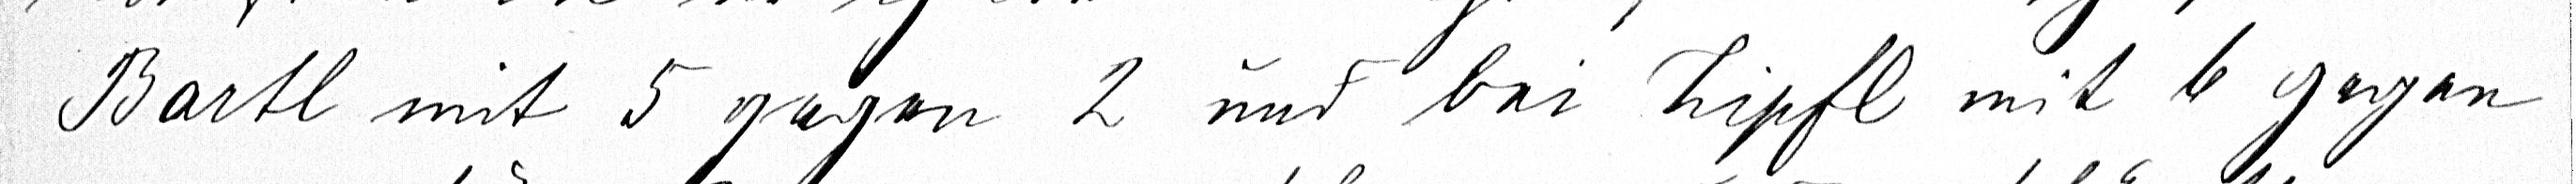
Bartl mit 5 gegen 2 und bei Zipfl mit 6 gegen
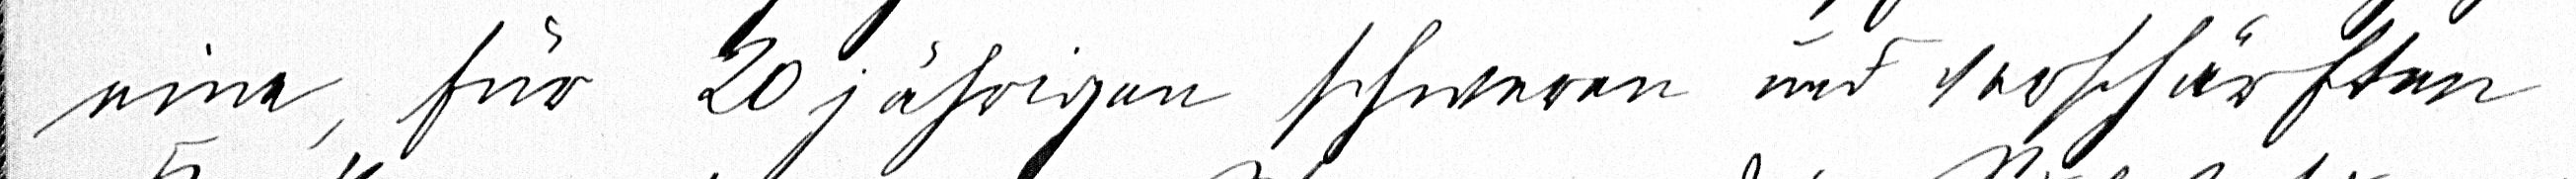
eine, für 20jährigen schweren und verschärften
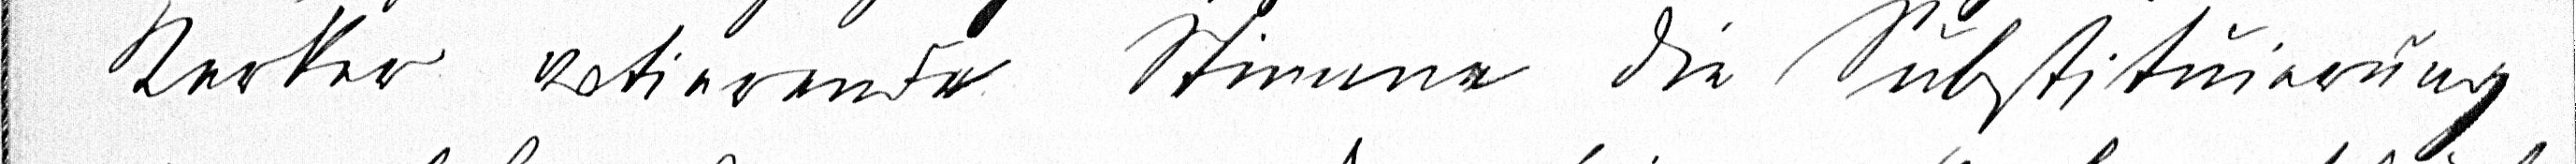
Kerker votierende Stimme die Substituierung
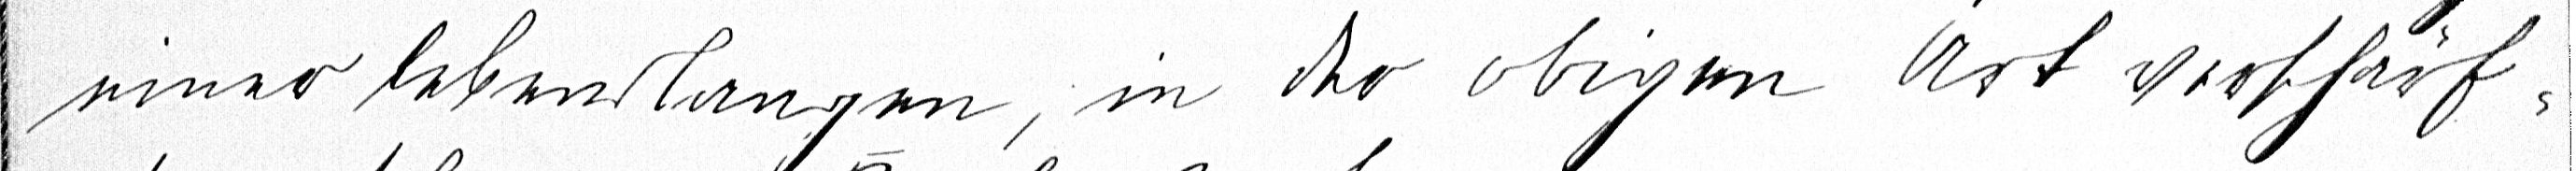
einer lebenslangen, in der obigen Art verschärf¬
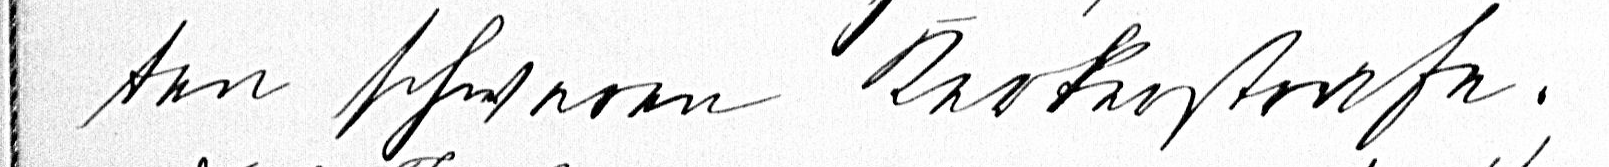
ten schweren Kerkerstrafe.
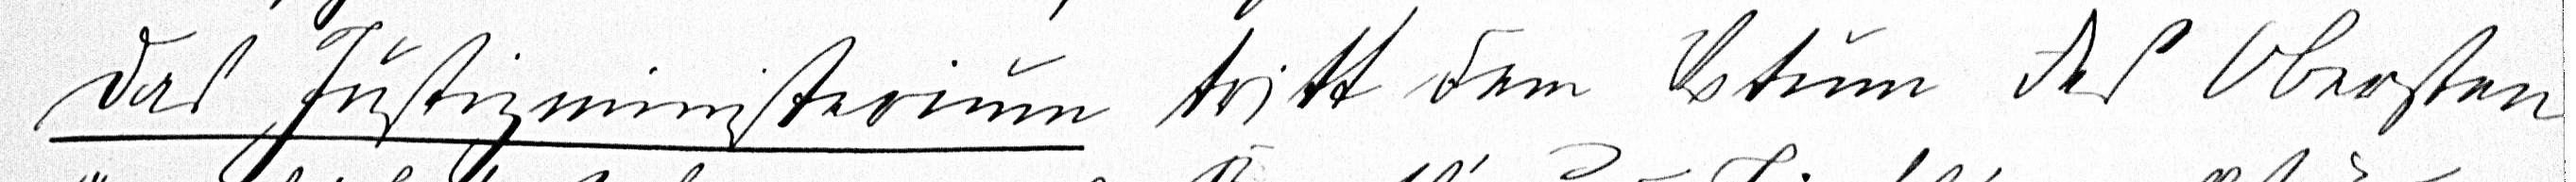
Das Justizministerium tritt dem Votum des Obersten
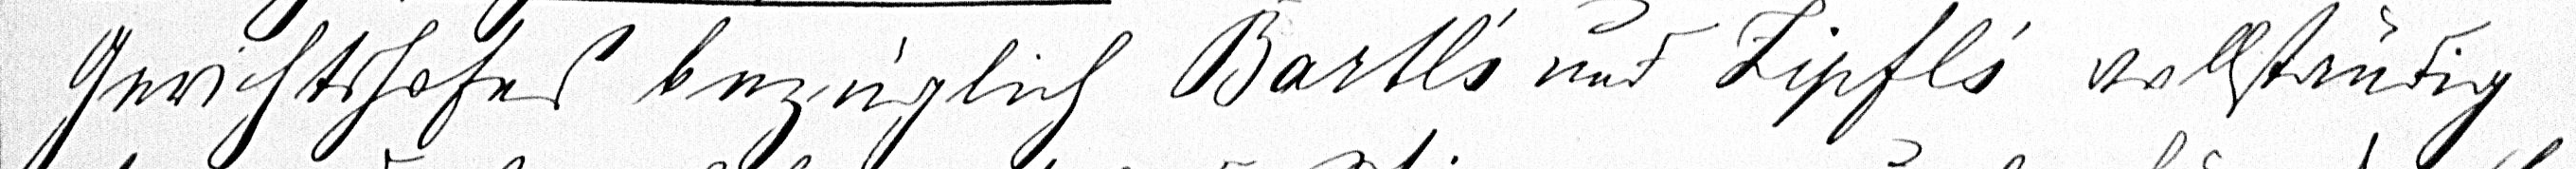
Gerichtshofes bezüglich Bartl's und Zipfl's vollständig
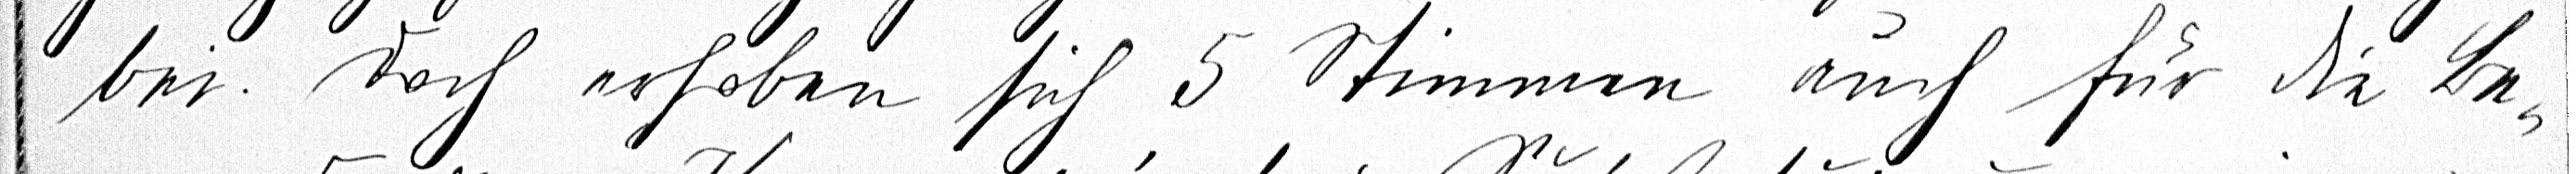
bei. Doch erhoben sich 5 Stimmen auch für de Be¬
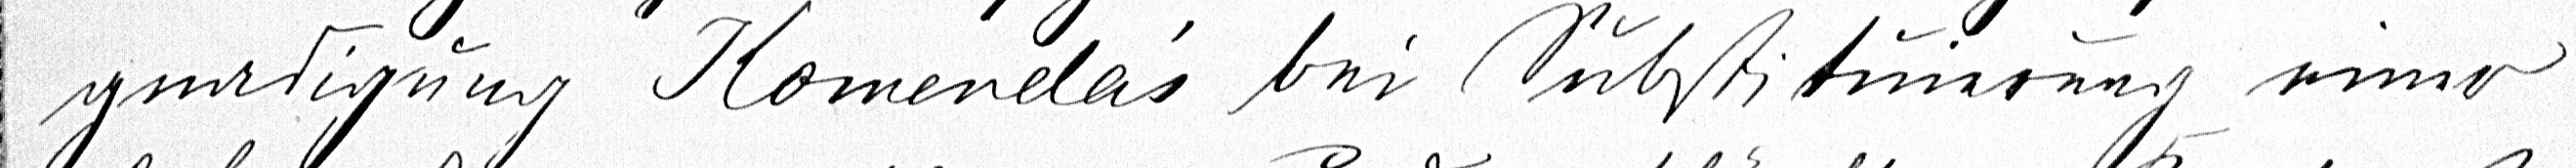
gnadigung Komendás bei Substituierung einer
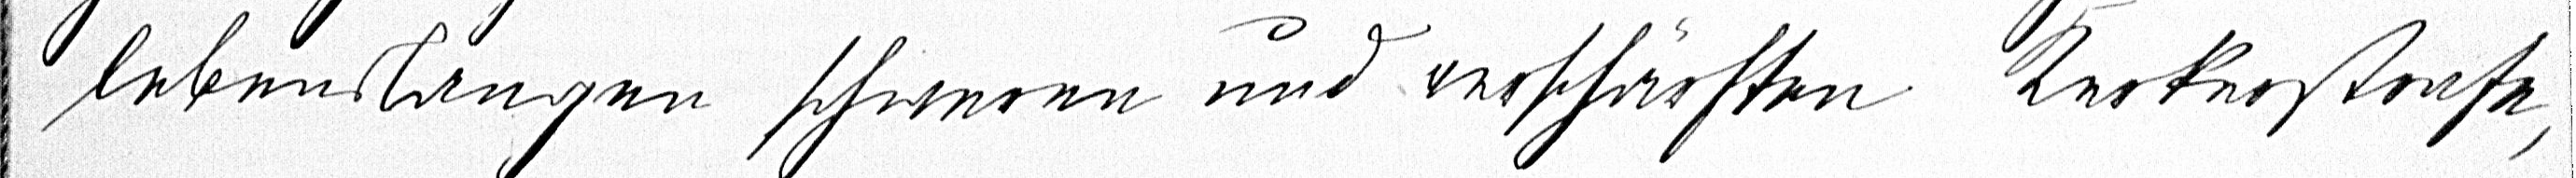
lebenlangen schweren und verschärften Kerkerstrafe,
